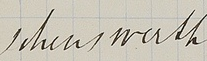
seine Antwort
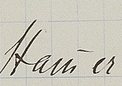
nun sehr
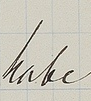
lieb
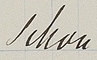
Sie in
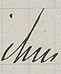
wün-
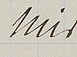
halten.
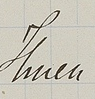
Bern
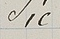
16.
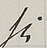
1876.
